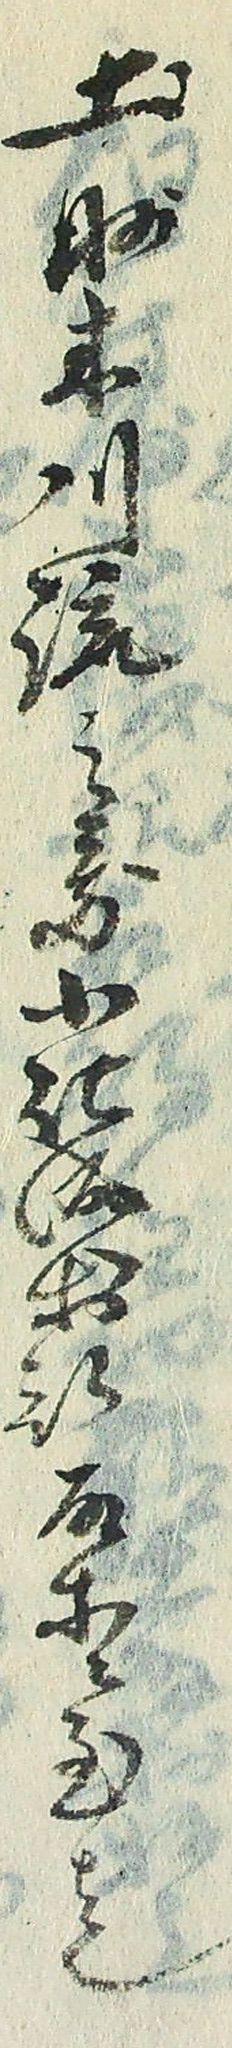土州木川流之義小仕成歩行取木に至迄
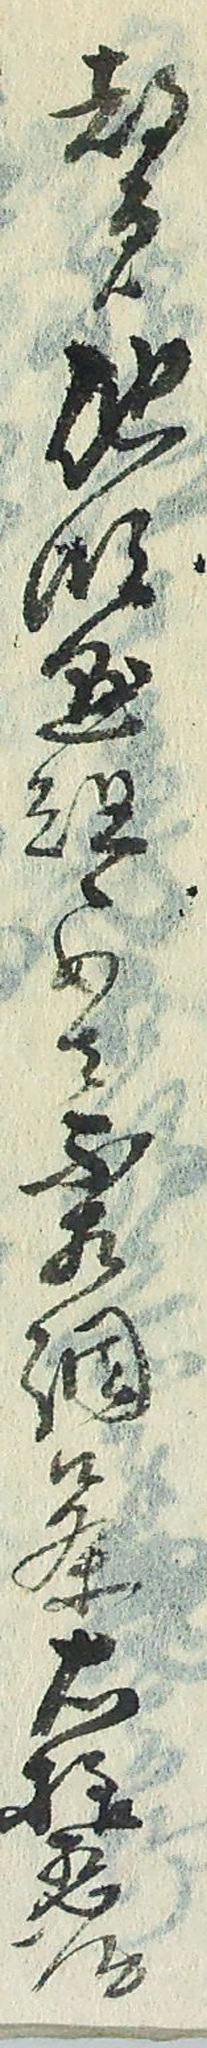都而は他領懸組候義は不相調候条右様相心得
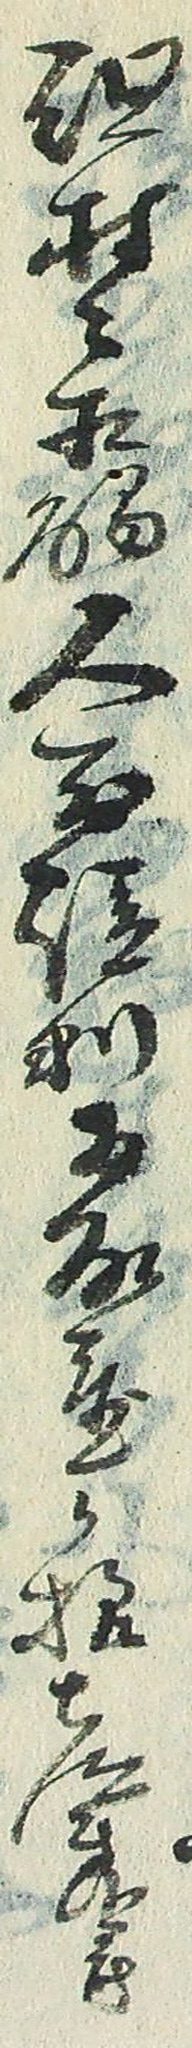組村々相触人別請判為取置候様被仰付候に付
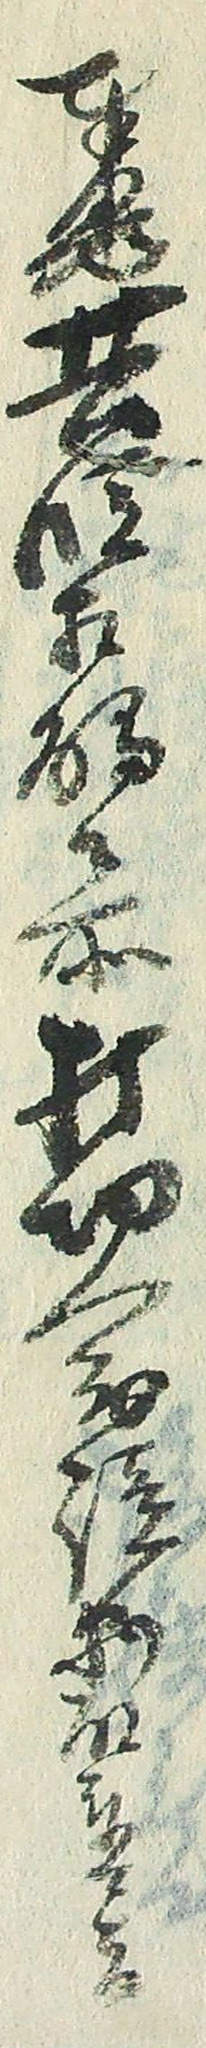奉畏其段相触候所村切人別請判取置候

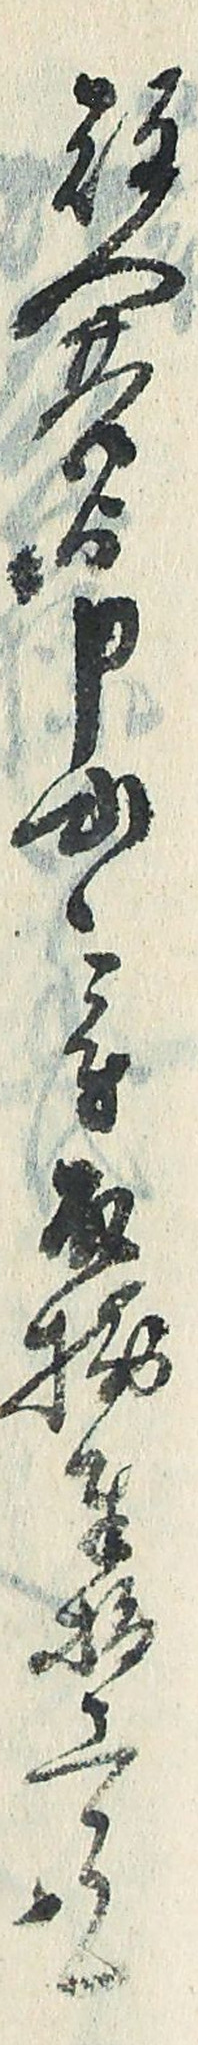役人共ゟ申出候に付取揃奉指上候以上
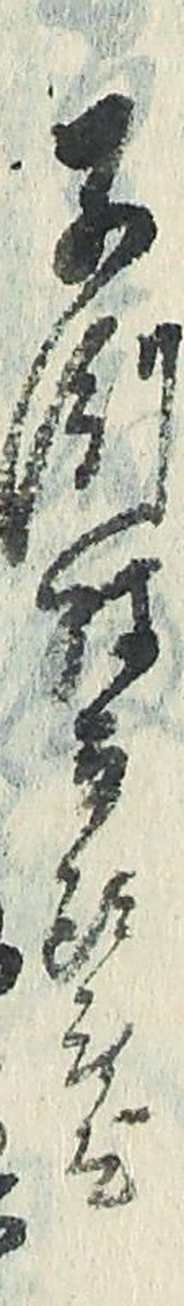早淵村与頭庄屋
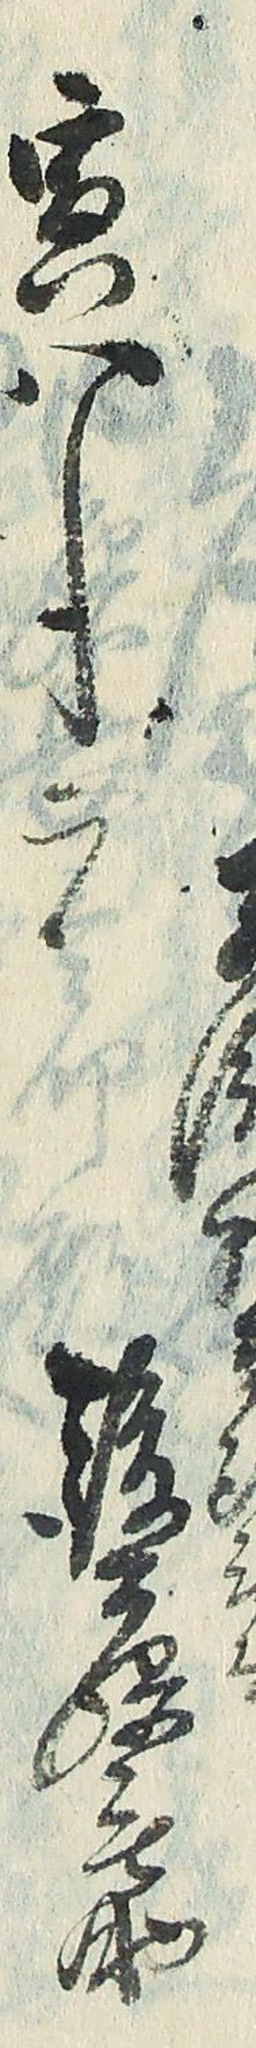寅八月二日後藤庄助
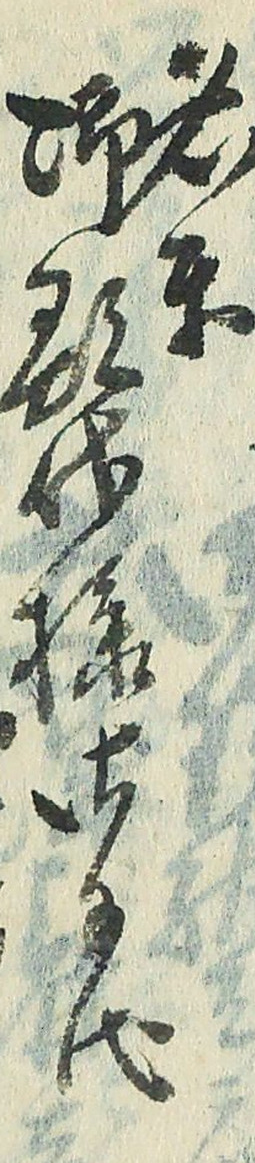御郡代様御手代
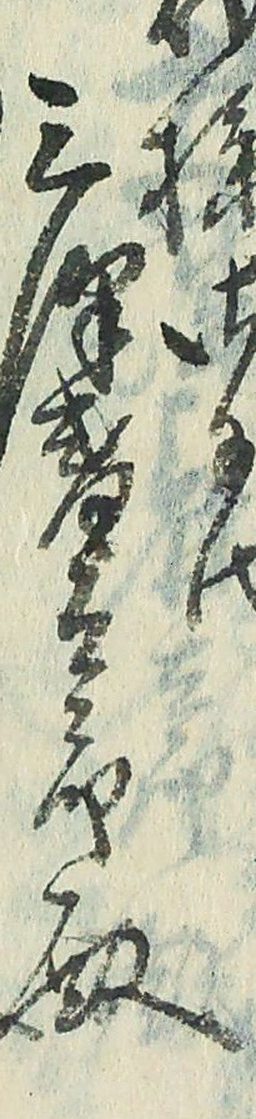三沢春太郎殿
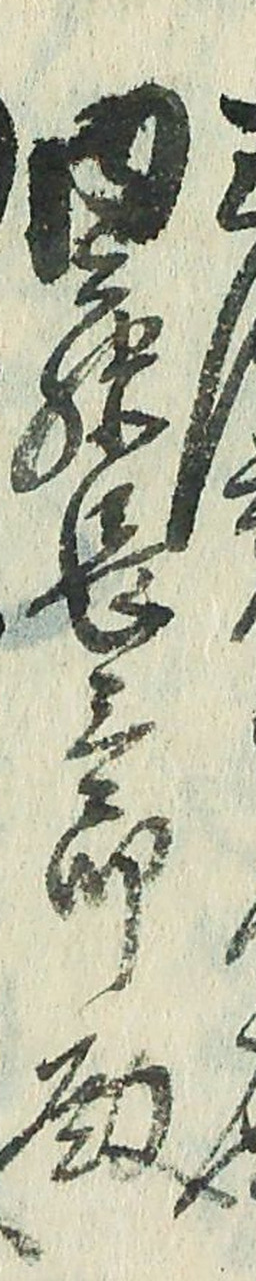内藤長三郎殿
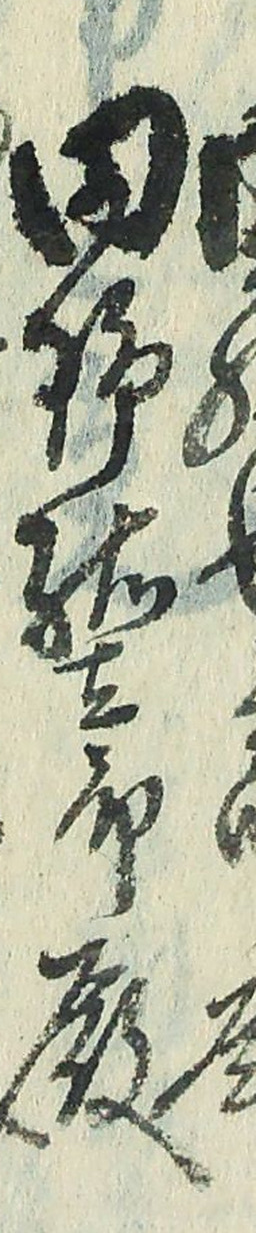田野祐太郎殿
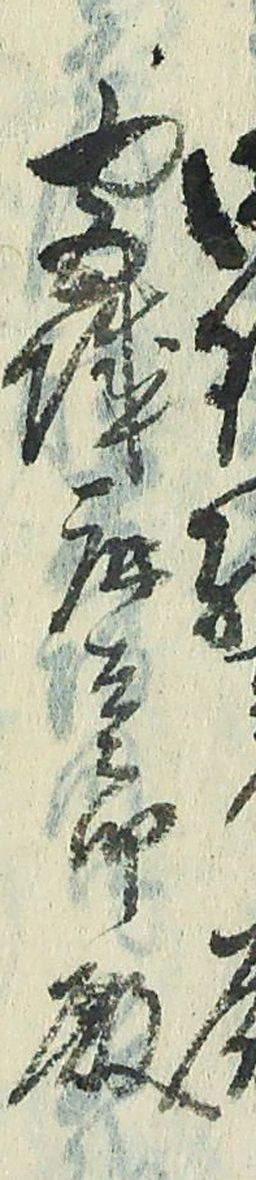宮城麻太郎殿
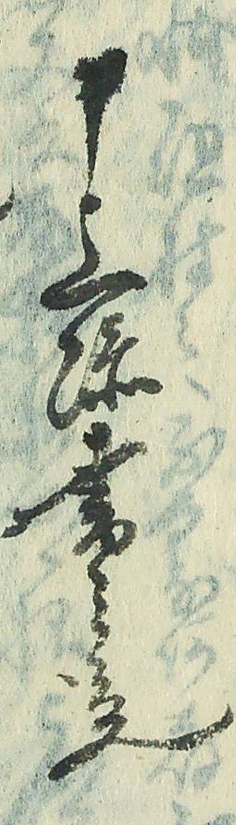申上添書之覚
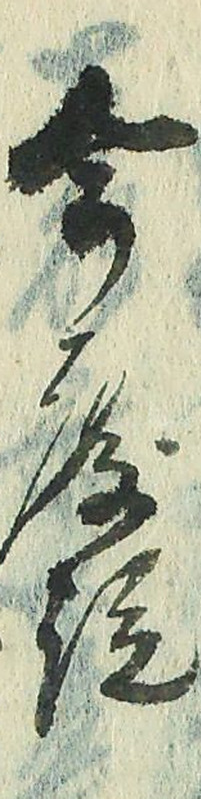今度従
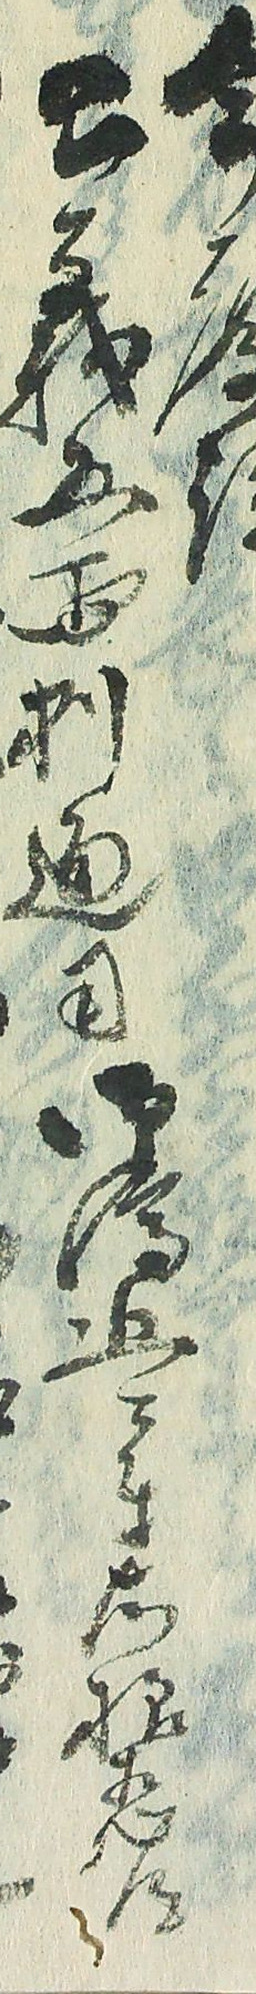公義五両判通用相停止に付右様相心得
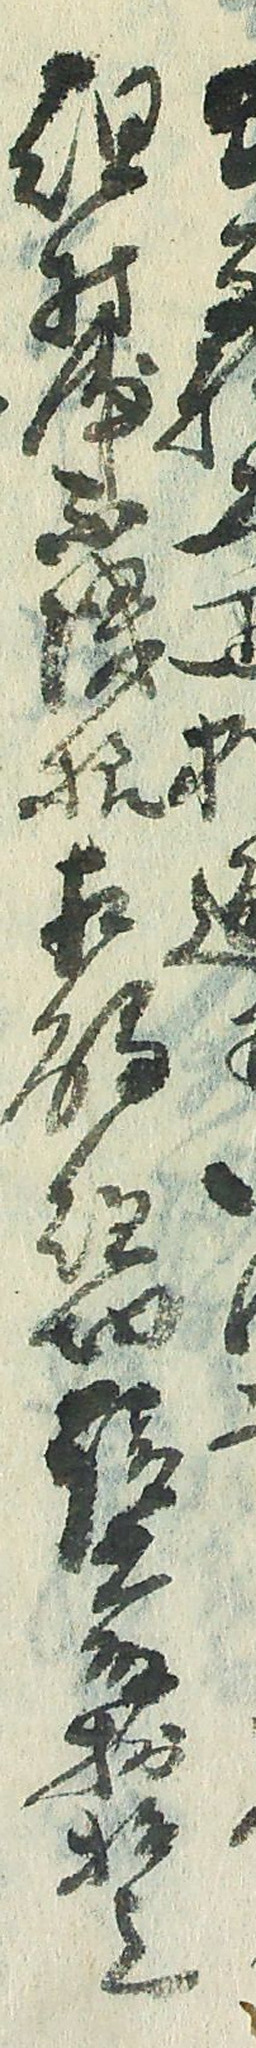組村浦不洩様相触組切請書取揃指上
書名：諸御用御□受書控
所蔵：鳴門教育大学 Naruto University of Education
